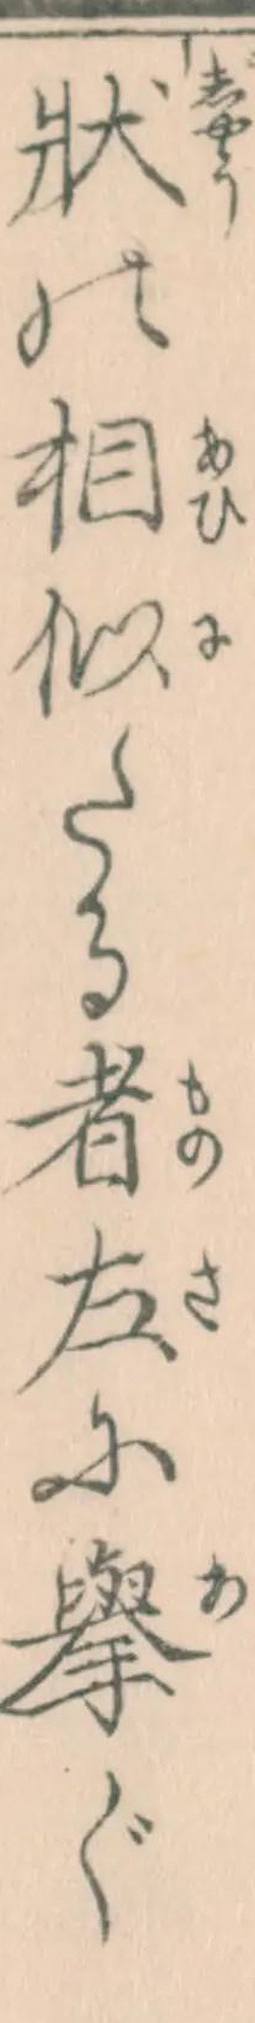-状の相似たる者左に挙ぐ
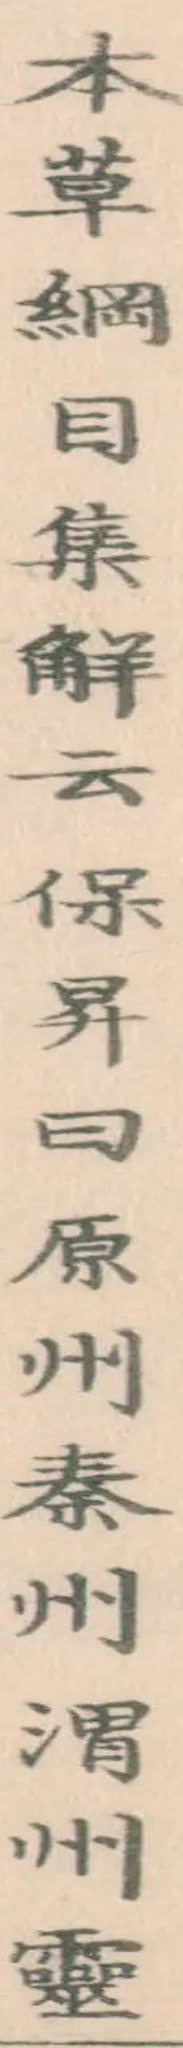本草綱目集解云保昇曰原州秦渭渭州霊
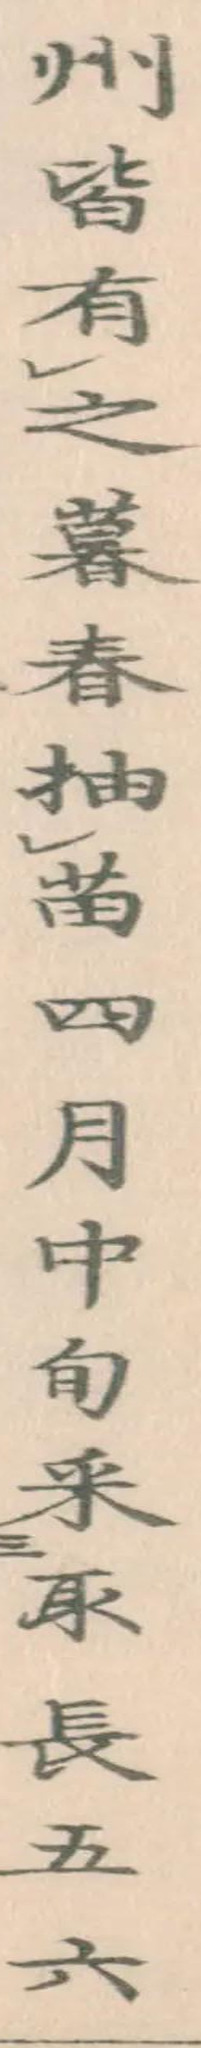州皆有之暮春抽苗四月中旬釆取長五六
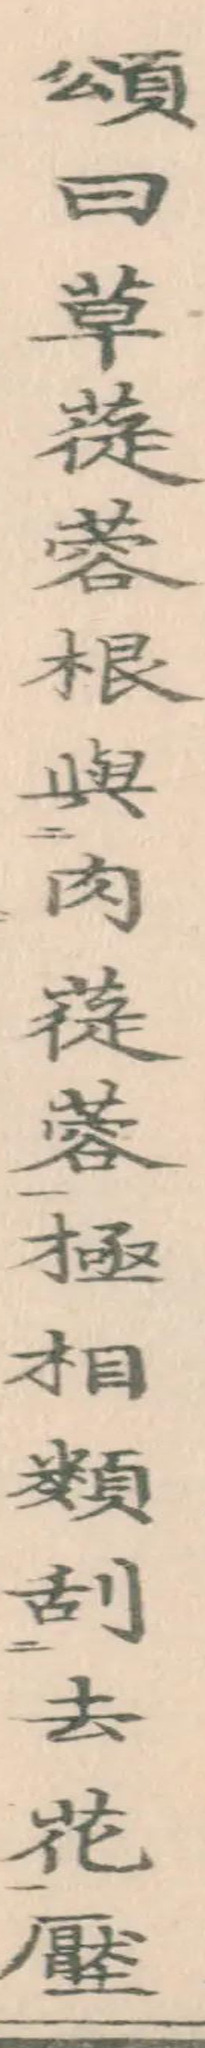頌曰草蓯蓉根與肉蓯蓉極相類刮去花壓
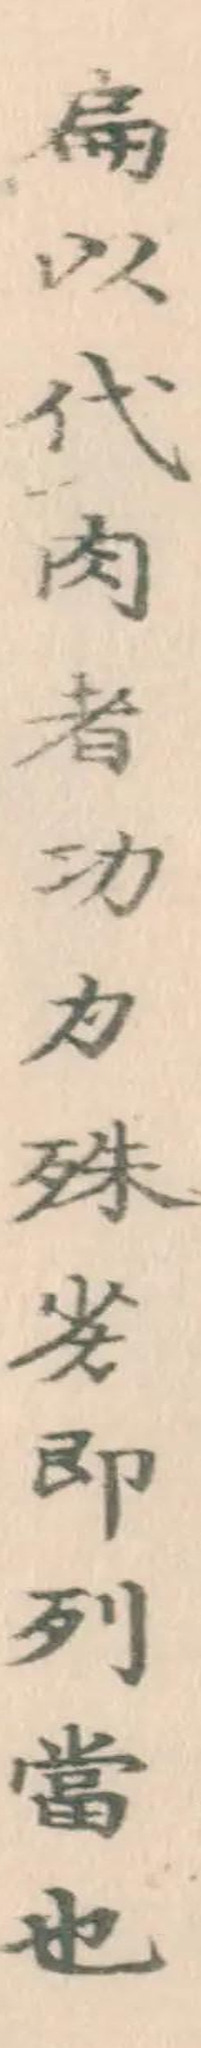扁以代肉者功力殊劣即列當也

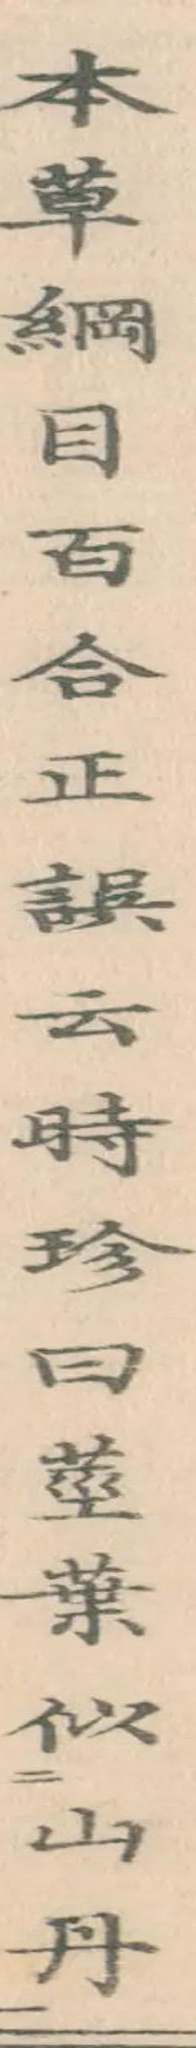本草綱目百合正誤云時珍曰茎葉似山丹
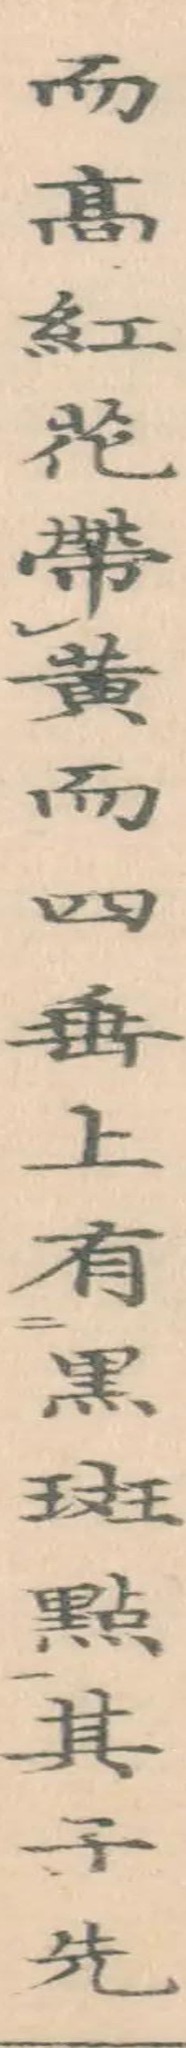而高紅花帯黄而四垂上有黒斑点其子先
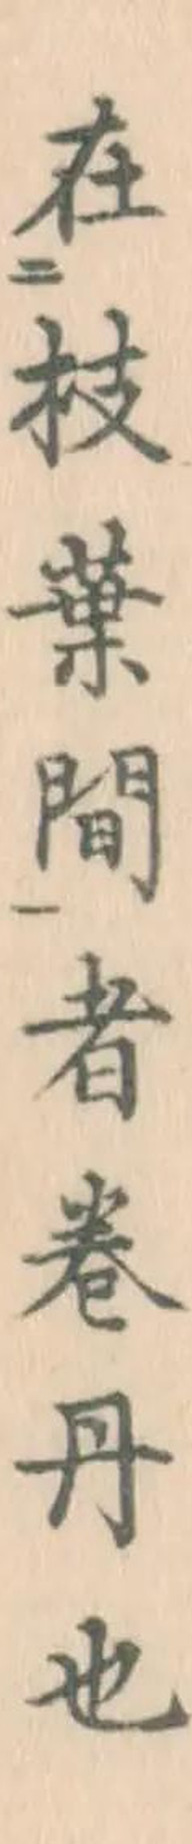在枝葉間者巻丹也

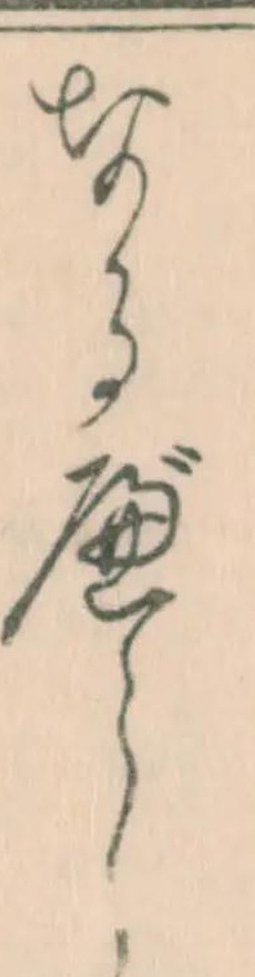なるべし

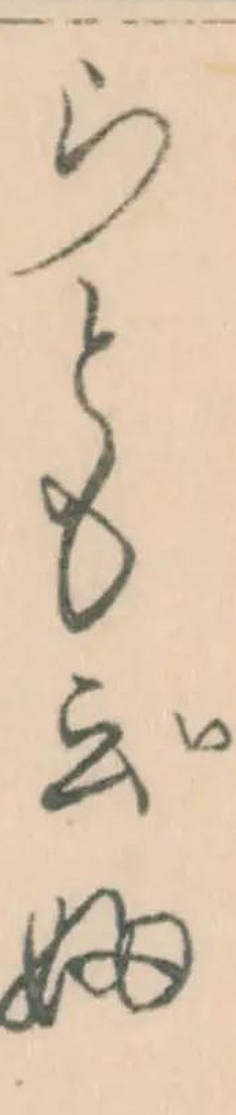らとも云ふ
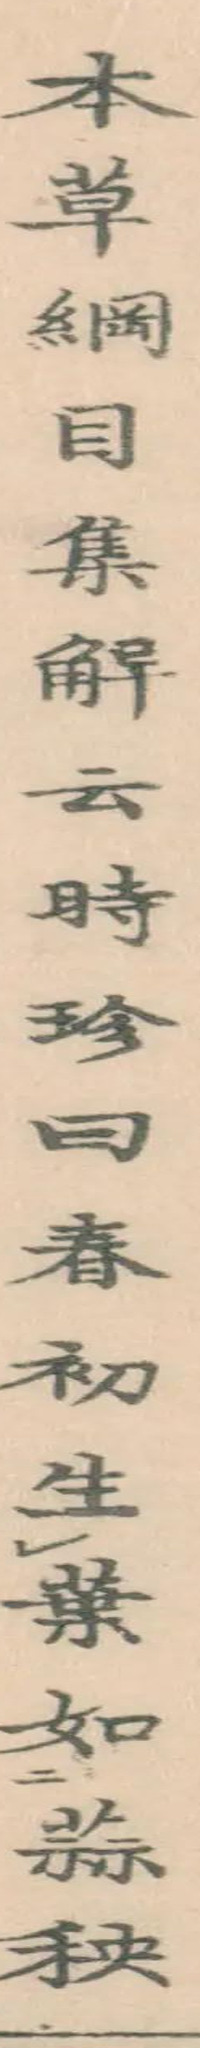本草綱目集解云時珍曰春初生葉如蒜秧
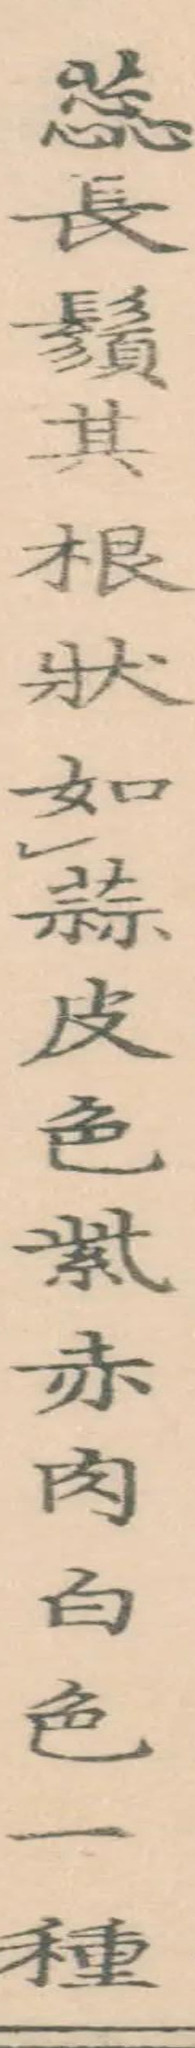蕊長鬚其根状如蒜皮色紫赤肉白色一種
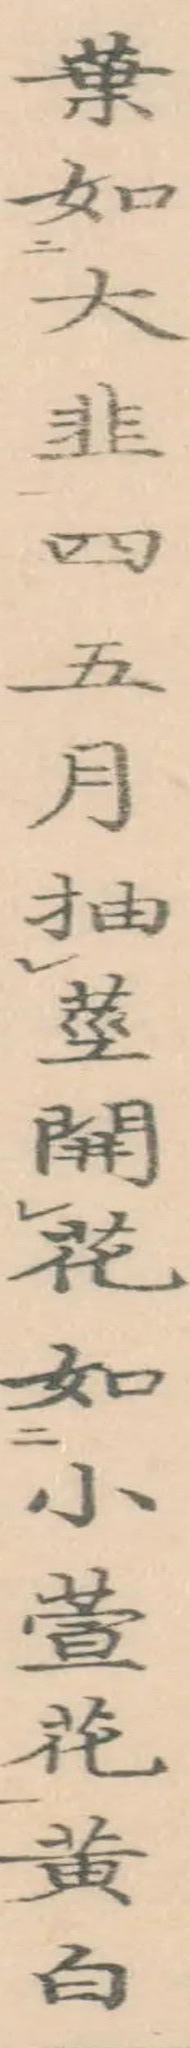葉如大韭四五月抽茎開花如小萱花黄白

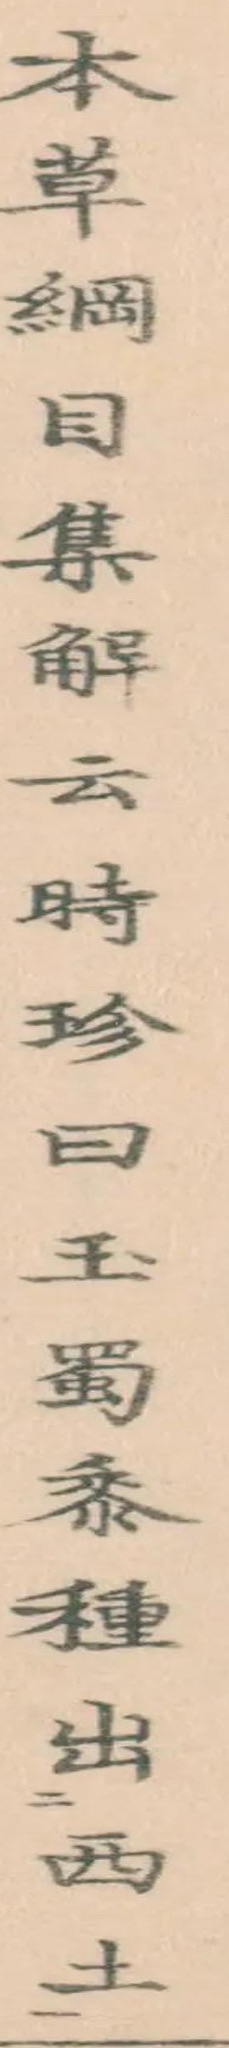本草綱目集解云時珍曰玉蜀黍種出西土
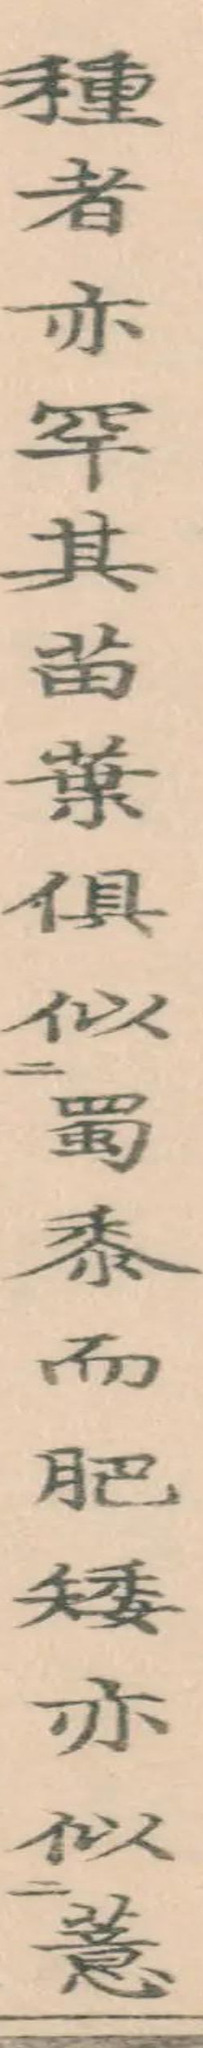種者亦罕其苗葉倶似蜀黍而肥矮亦似薏
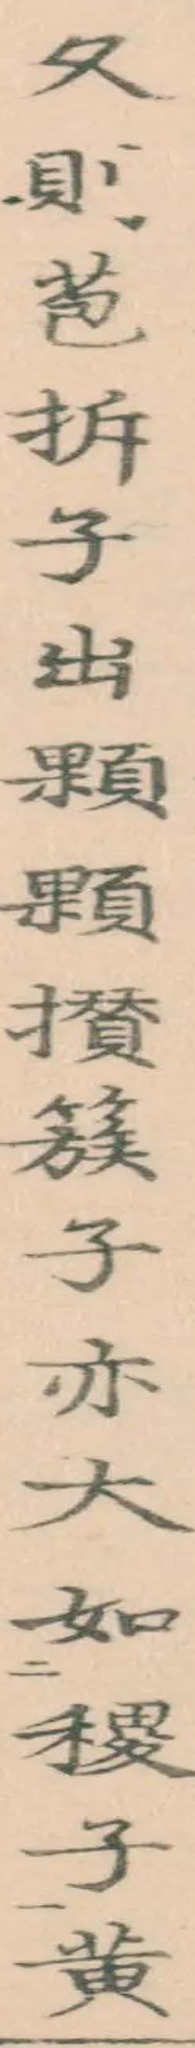則苞折子出顆顆攅簇子亦大如稷子黄
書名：草木性譜 3巻. [2]
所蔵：国立国会図書館 National Diet Library, JAPAN
